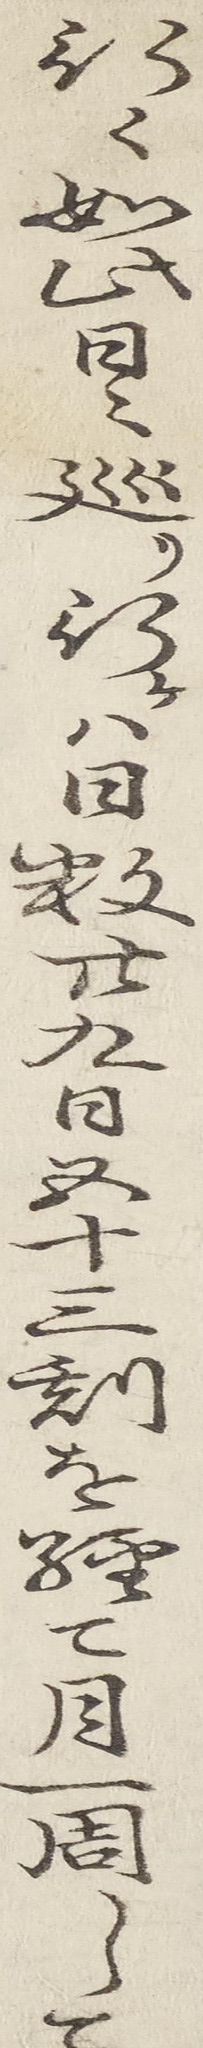行く如此日々巡リ行ケは日数廿九日五十三刻を経て月一周して
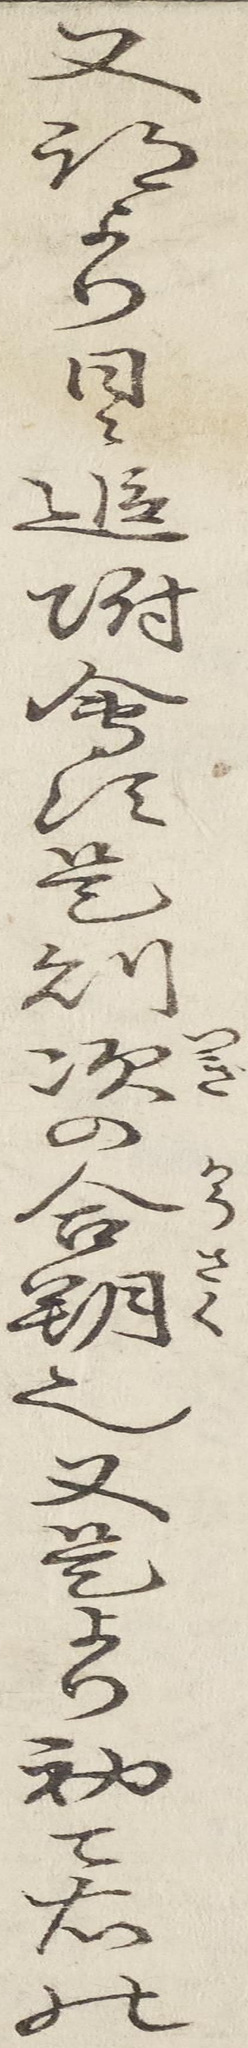又跡より日々追附会す是則次の合朔也又是より初て右の
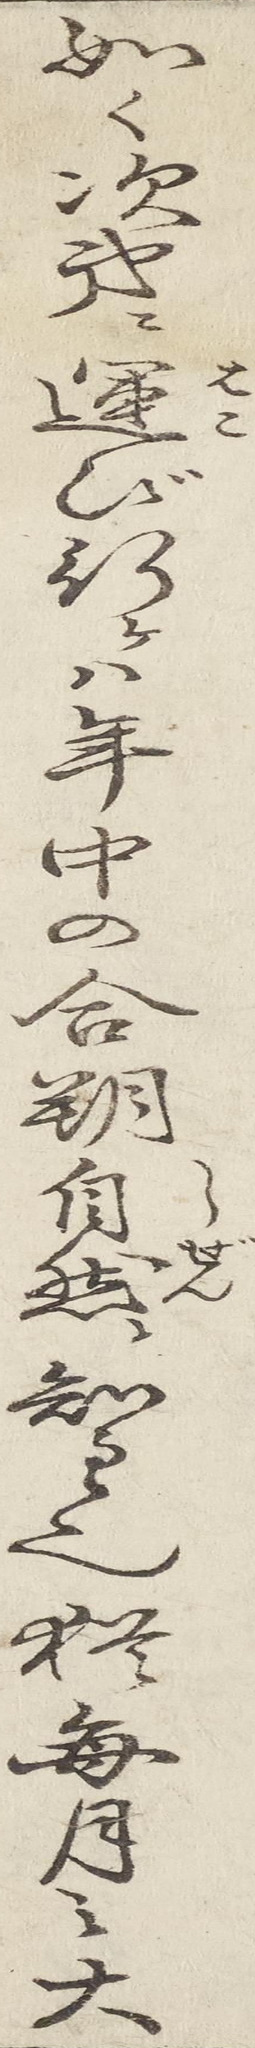如く次第ニ運び行ケは年中の合朔自然ニ知るゝ也猶毎月之大
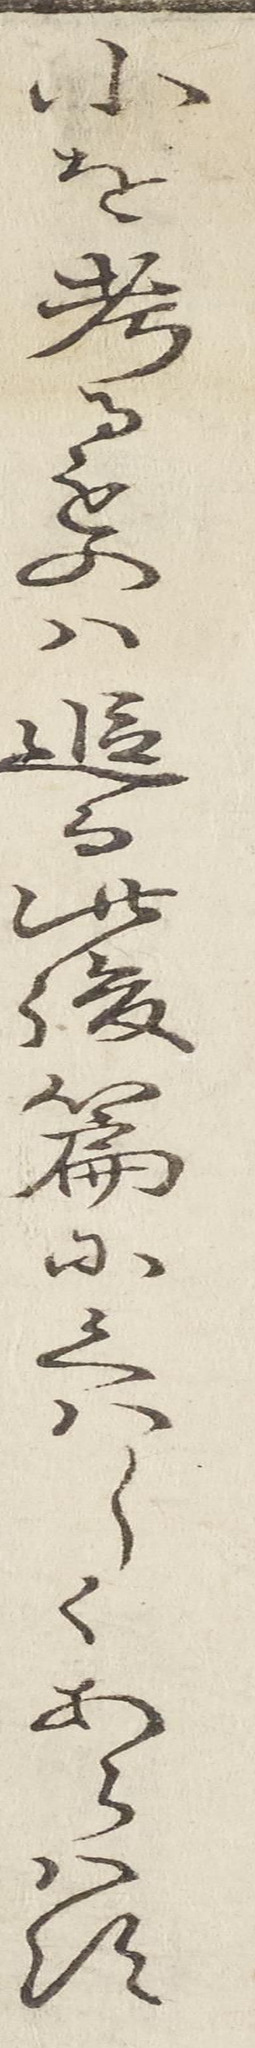小を考るものは追而此後篇にくはしくあらはす
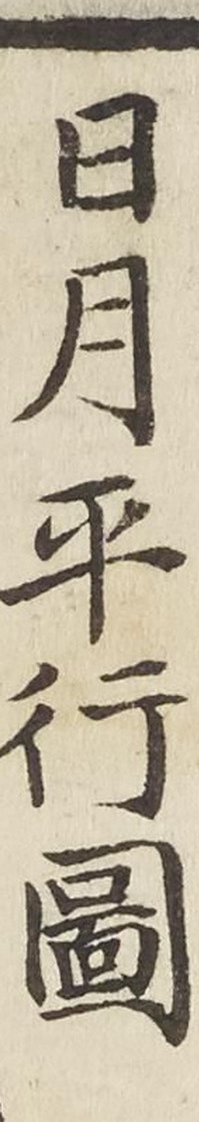日月平行図
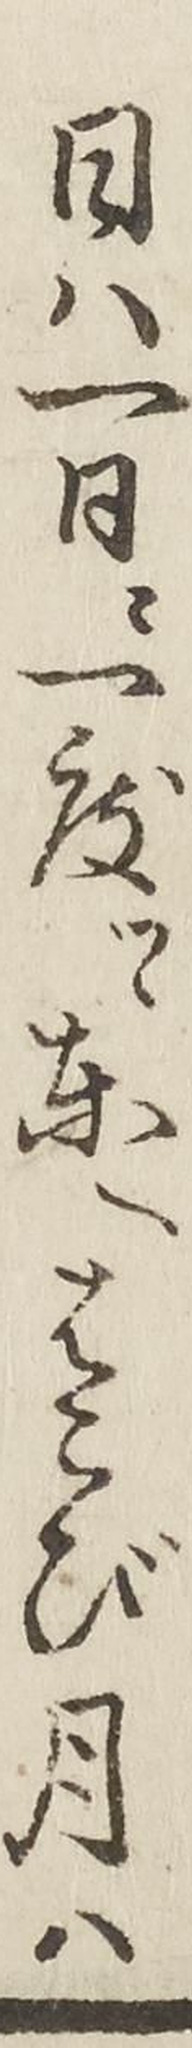日は一日ニ一度つゝ東へはこび月は
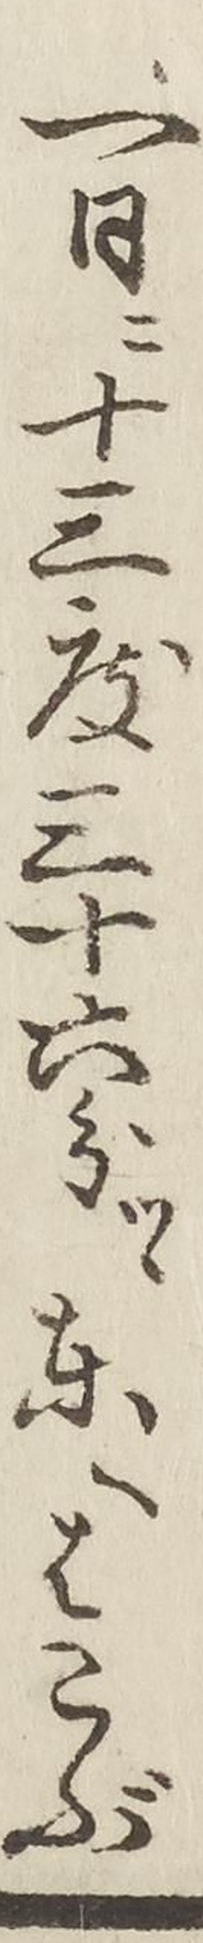一日ニ十三度三十六分つゝ東へはこぶ
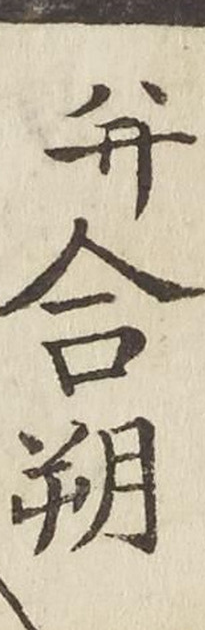幷合朔
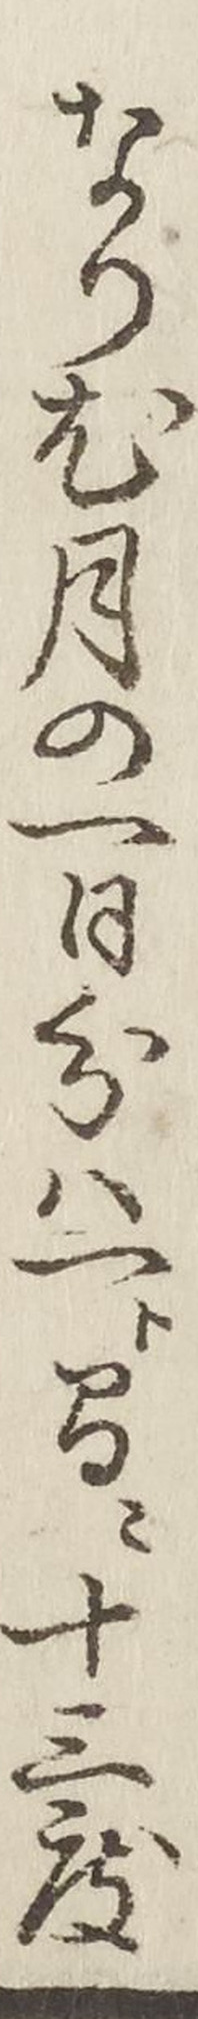なり尤月の一日分は一ト間ニ十三度
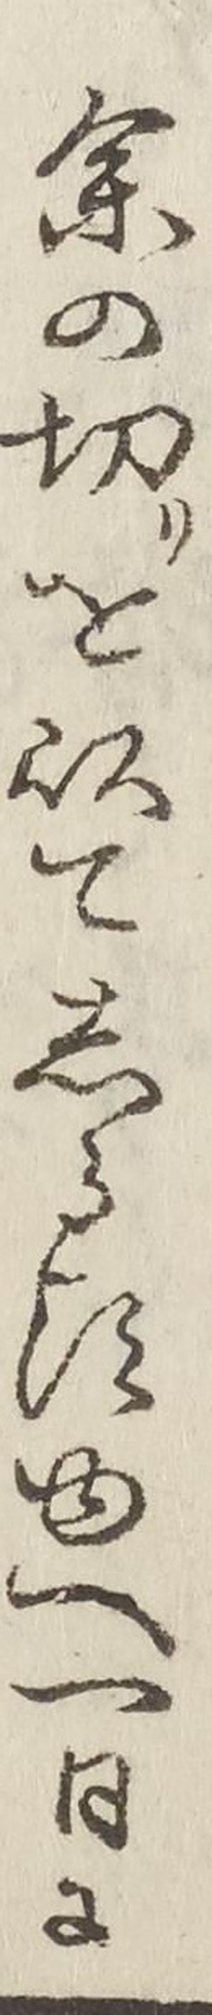余の切りを以てしるすゆへ一日に
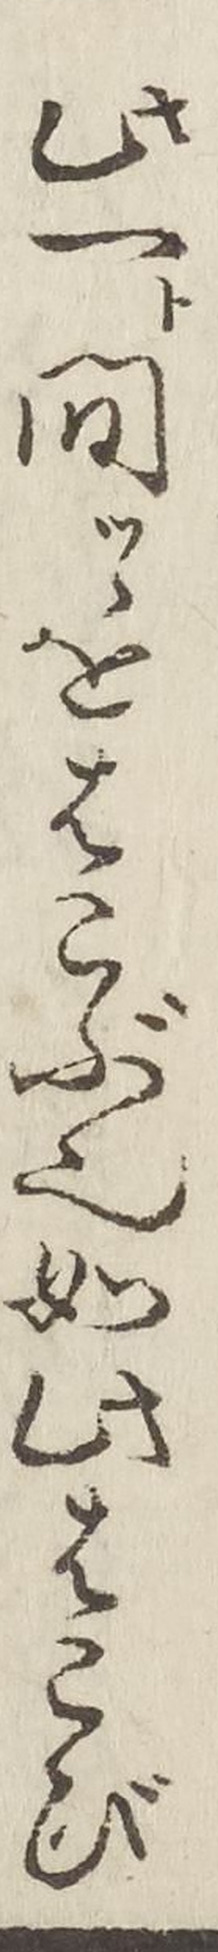此一ト間つゝをはこぶ也如此はこび
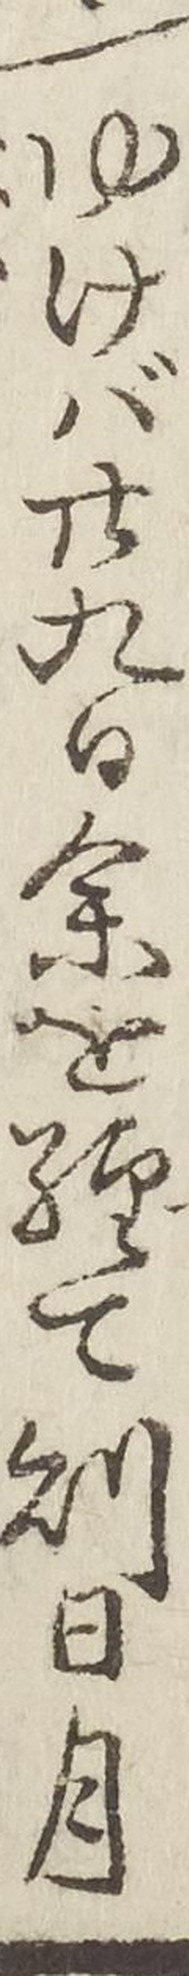ゆけば廿九日余を経て則日月
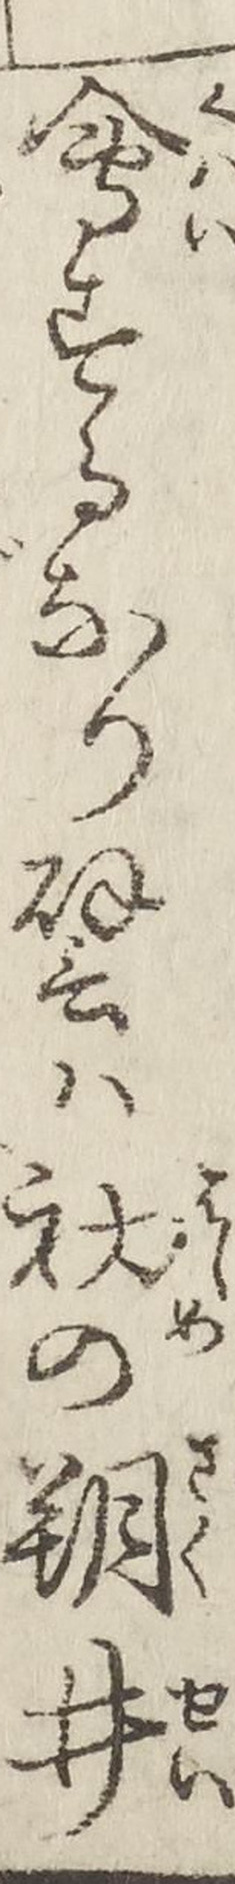会するなり譬は初の朔井
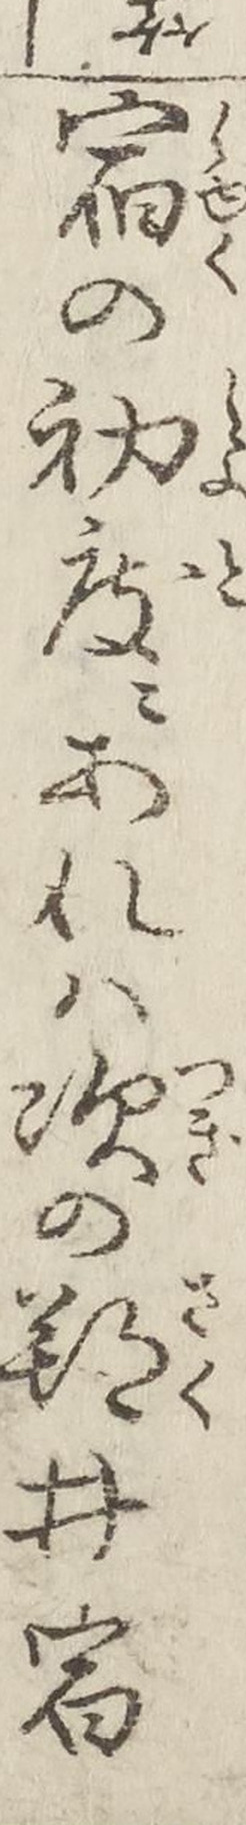宿の初度ニあれは次の朔井宿
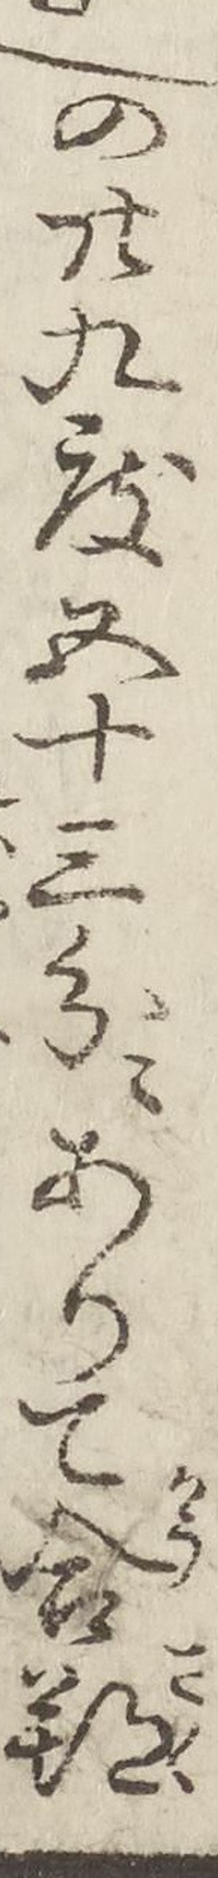の二十九度五十三分ニありて合朔
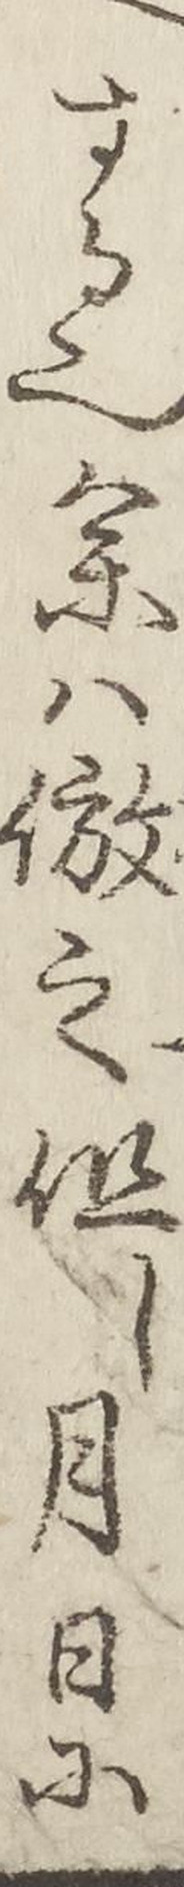する也余は倣之但し月日に
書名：平天儀圖解
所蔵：東京大学地震研究所図書室 Earthquake Research Institute Library, The University of Tokyo, JAPAN
